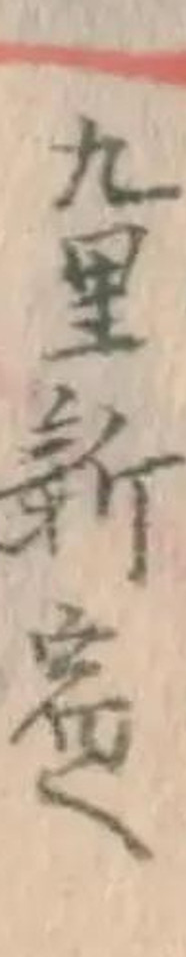九里新宿へ
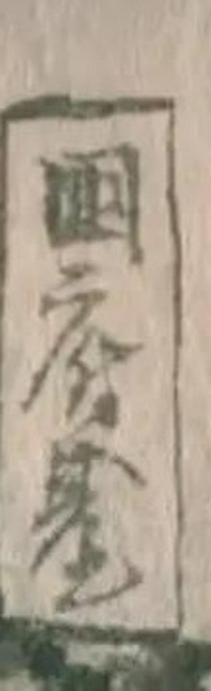国府台
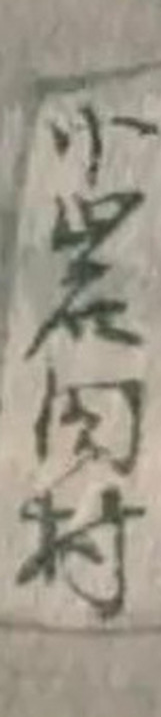小岩田村

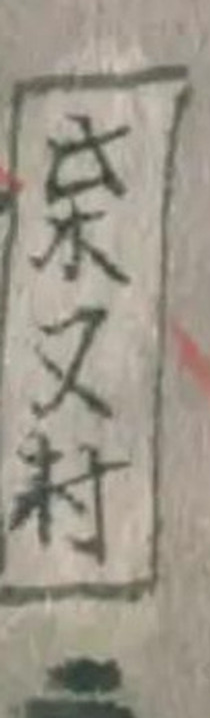柴又村
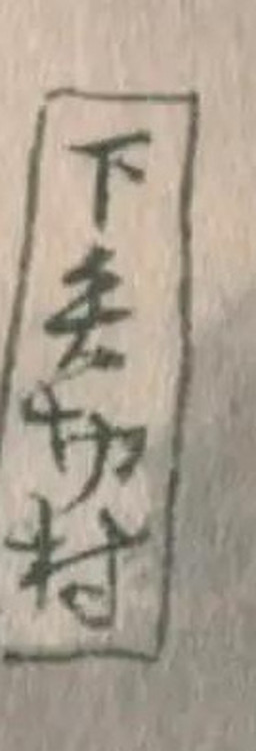下矢切村
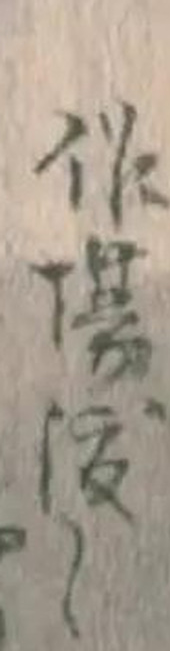作場渡し
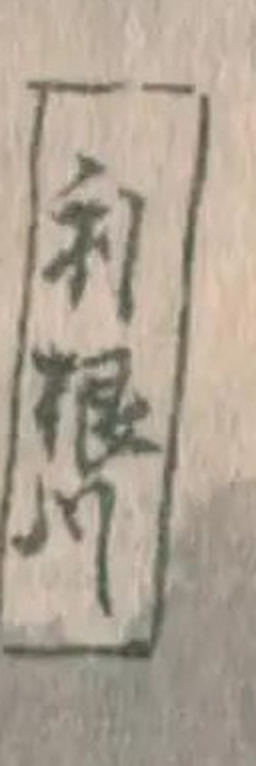利根川
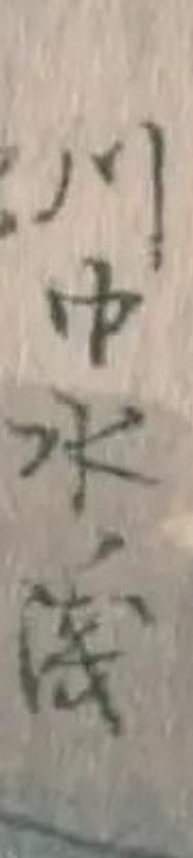川中水ノ浅
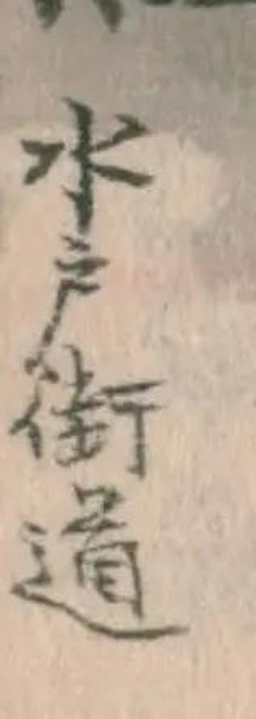水戸街道
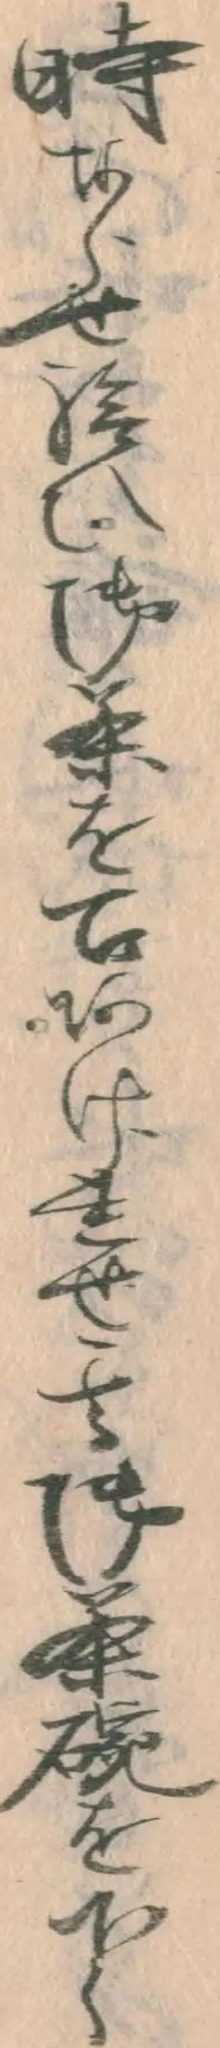時ならせ給ひ御茶を召あけれせ其御茶碗を下し
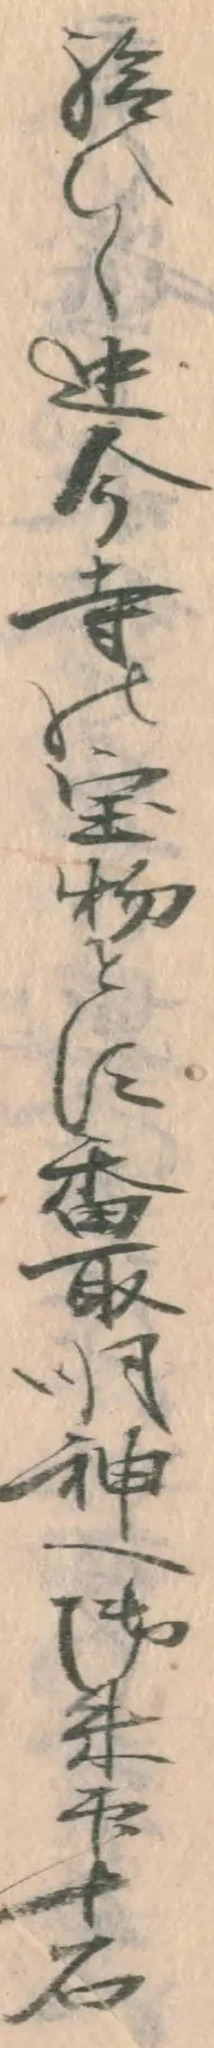給ひし迚今寺の宝物とす香取明神へ御朱印十石
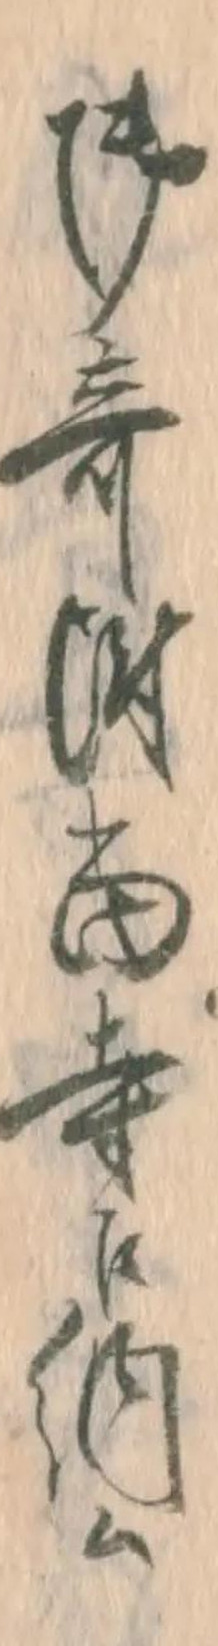御寄附当寺え納候
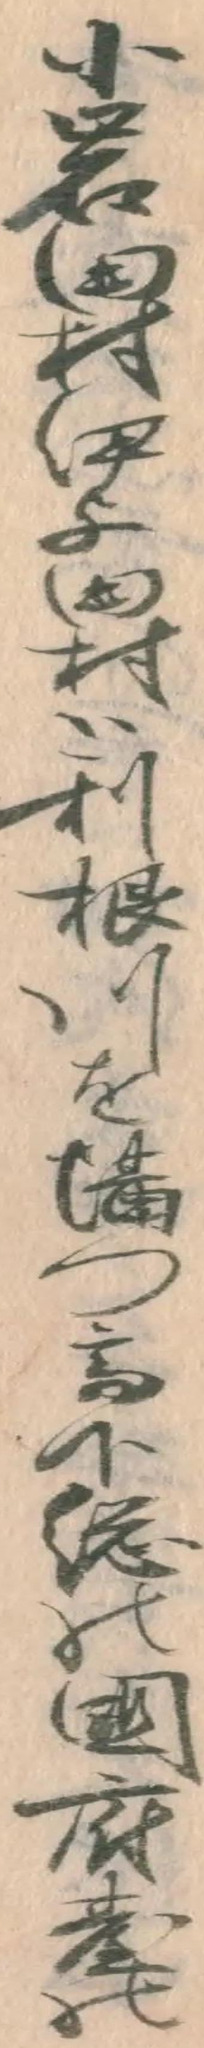小岩田村伊与田村は利根川を隔つて下総の国府台の
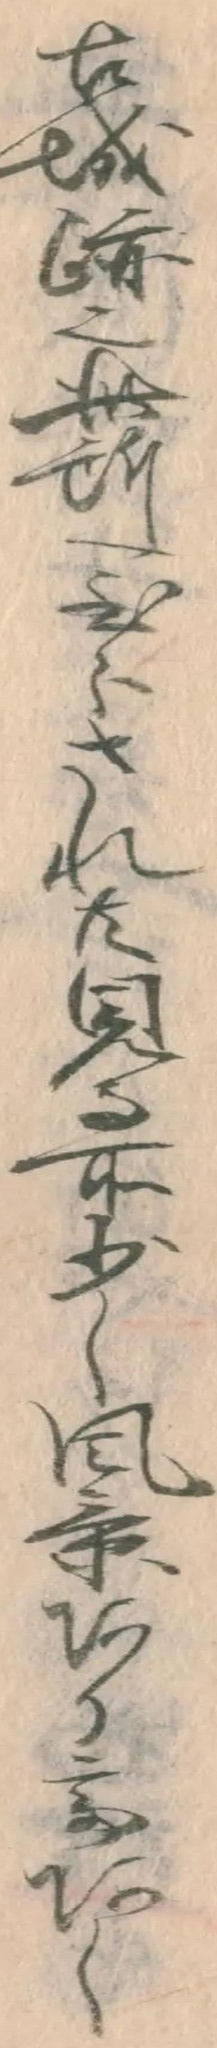古城跡也此所へ至らされ共見る所少し風景ありてあし
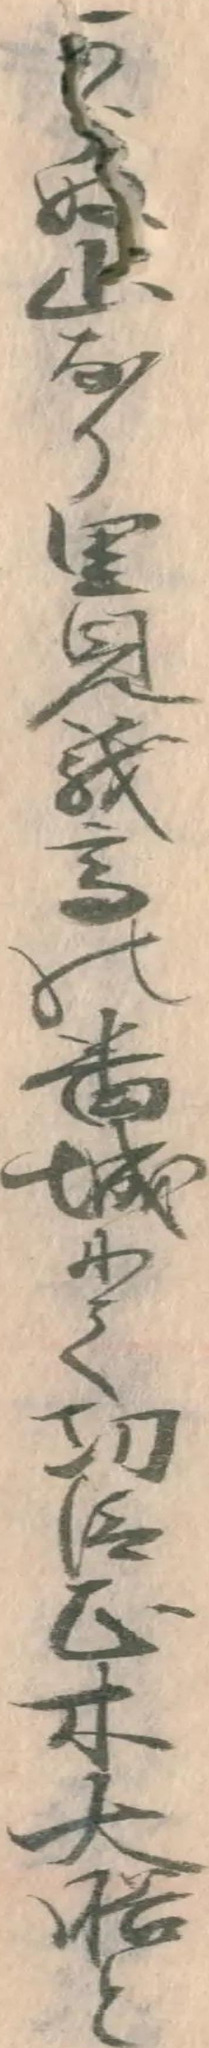からぬ山なり里見義高の藩番城にて功臣正木大膳と
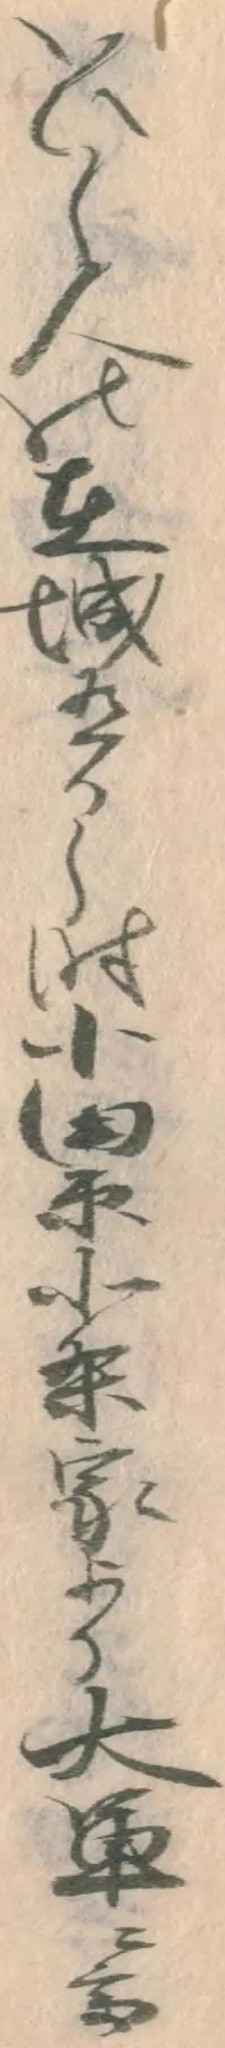いひし人の在城有りし時小田原北条家より大軍にて
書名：四神地名録 6巻. [4]葛飾郡
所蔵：国立国会図書館 National Diet Library, JAPAN
